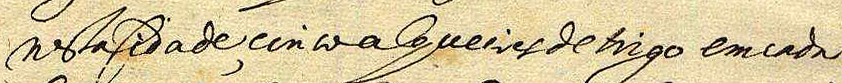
nesta Cidade, cinco alqueires de trigo em cada
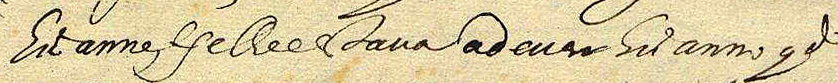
hū anno, E se lhe estaua a deuer hū anno qdo
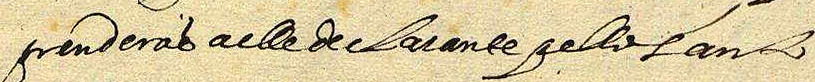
prenderaõ a elle declarante pello santo
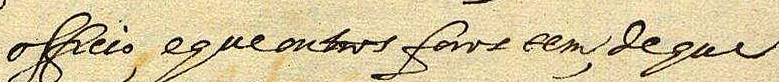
officio, e que outros foros tem, de que
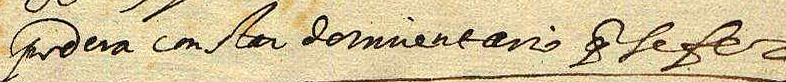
podera constar do inuentario q̄ se fez
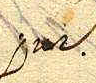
jur.
